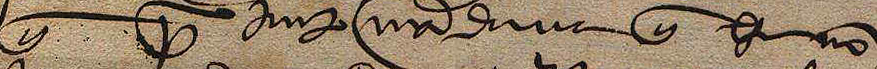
e q̄ p̄otanto m̄adaua q̄ lhe nō
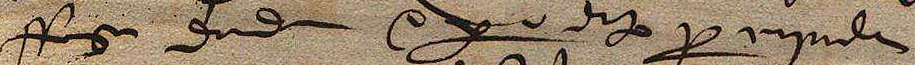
ffose dada e ꝑ o dito ꝓcurador
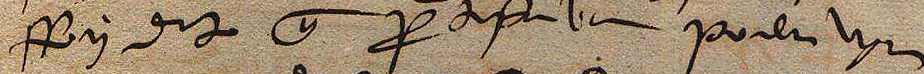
ffoy dito q̄ ꝓtestava poder vyr
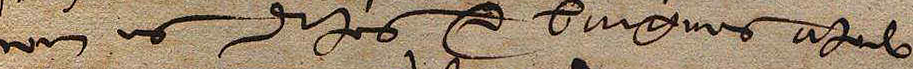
com os ditos ēbarguos a todo
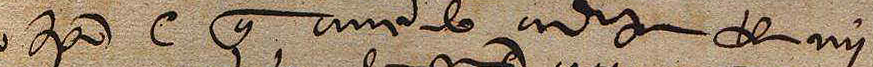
o tpō e q̄ auēdo a dita Re mj
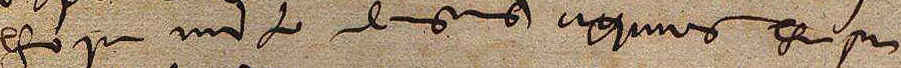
lhoramēto de seus agrauos lhe ser
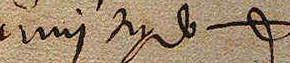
amjtydo
